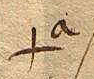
ta
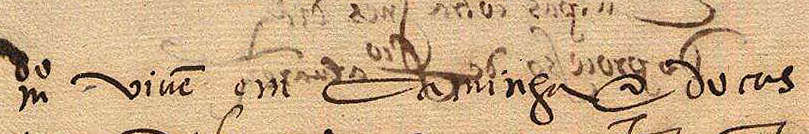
m_o viuē em Caminha e do cus
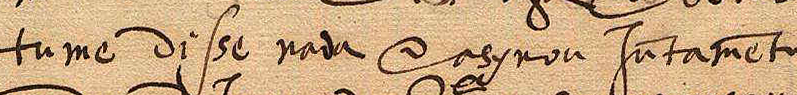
tume disse nada e asynou Jūtamēte
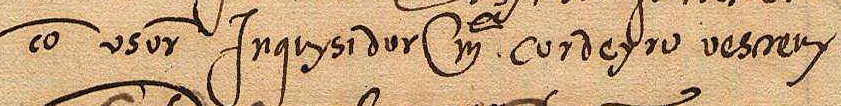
cō o sōr Jnquysidor mel cordeyro o escreuy
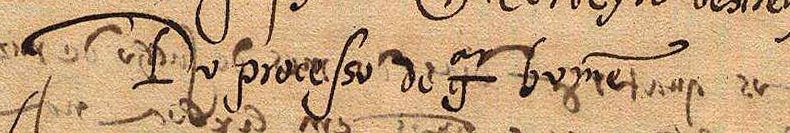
Do processo de gar homē
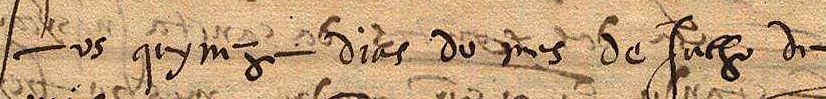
Aos quymze dias do mes de Julho de
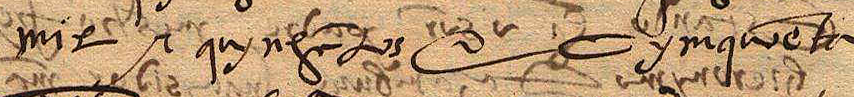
miL e quynhētos e Cymquoēta
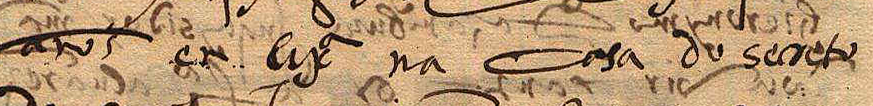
an̄os em lixa na Casa do secreto
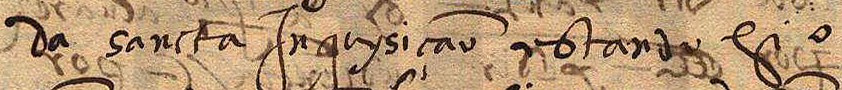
da sancta Jnquysição estando hi o
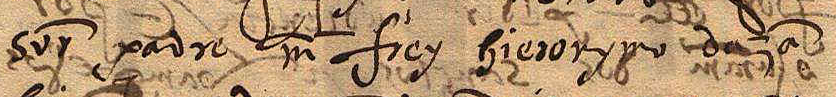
sōr padre mte frey hieronymo dazā
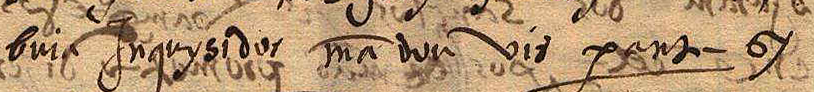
buia Jnquysidor mādou vir ꝑante sy
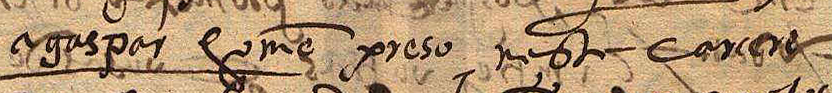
a gaspar homē preso neste carcere
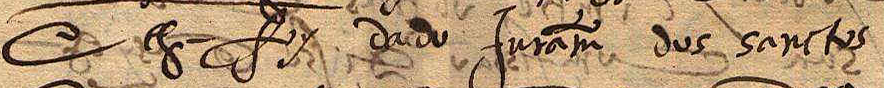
e lhe foy dado Juramto dos sanctos
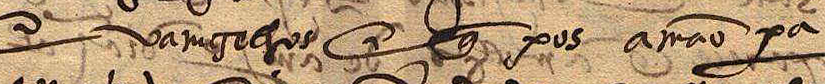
evamgelhos ē q̄ pos a mão ꝑa
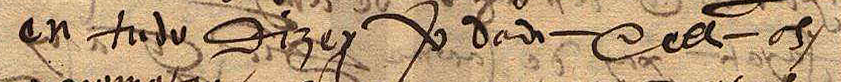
en tudo dizer Ꝟdade e elle asy
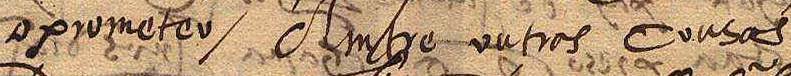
o prometeo / Amtre outras cousas
